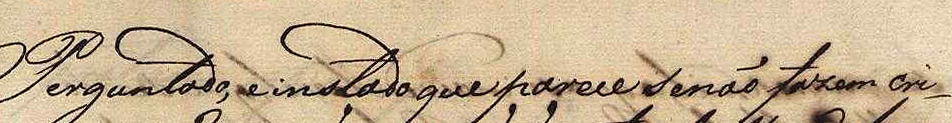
Perguntado, e instado que parece se naõ fazem cri
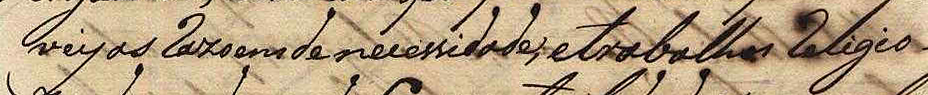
veis as Razoens de necessidade, e trabalhos Religio
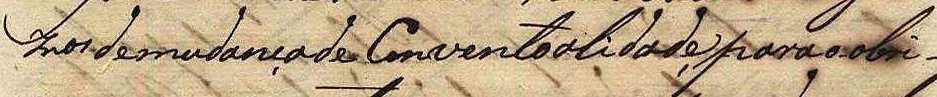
zos de mudança de Conventoalidade, para o-obri
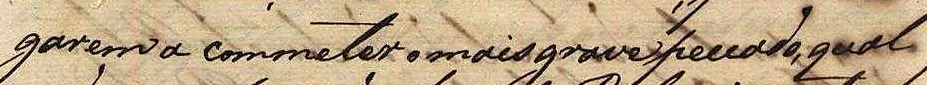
garem a commeter o mais grave peccado, qual
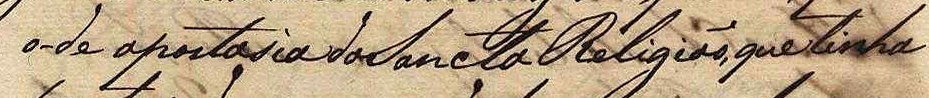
o-de apostasia da Sancta Religiaõ, que tinha
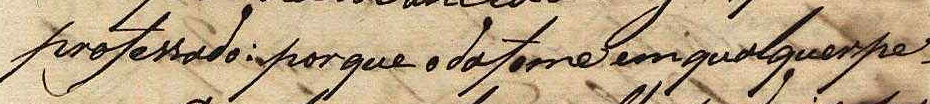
professado: porque o da fome em qualquer pe
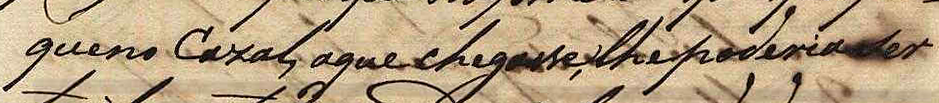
queno Cazal, a que chegasse lhe poderia ser
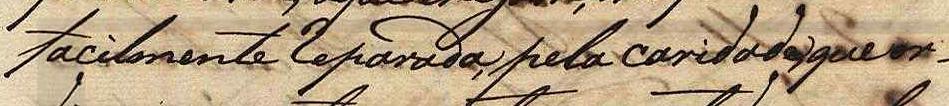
facilmente Reparada, pela caridade, que or
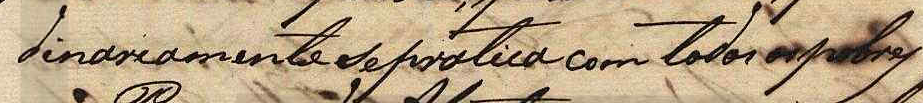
dinariamente se pratica com todos os pobres
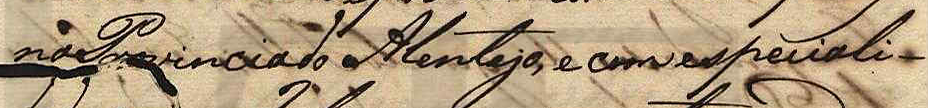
na Provincia do Alentejo, e com especiali
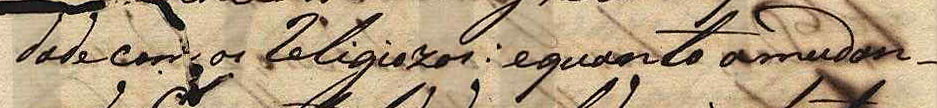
dade com os Religiozos: e quanto a mudan
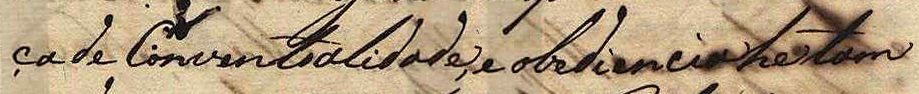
ça de Conventoalidade, e obediencia he tam
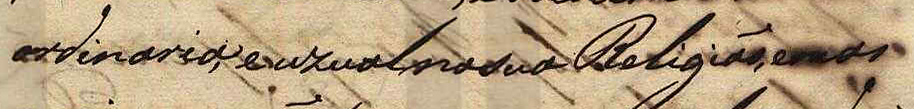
ordinaria, e uzual na sua Religiaõ, e nas
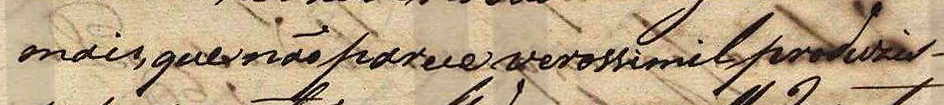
mais, que naõ parece verossimil produzis
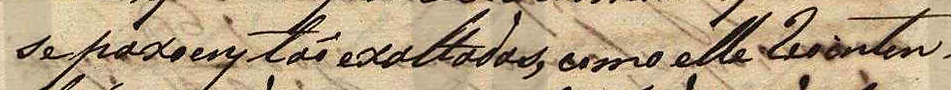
se paxoens taõ exaltadas, como elle Reo inten
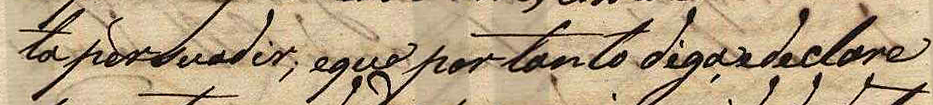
ta persuadir; e que portanto diga, e declare
